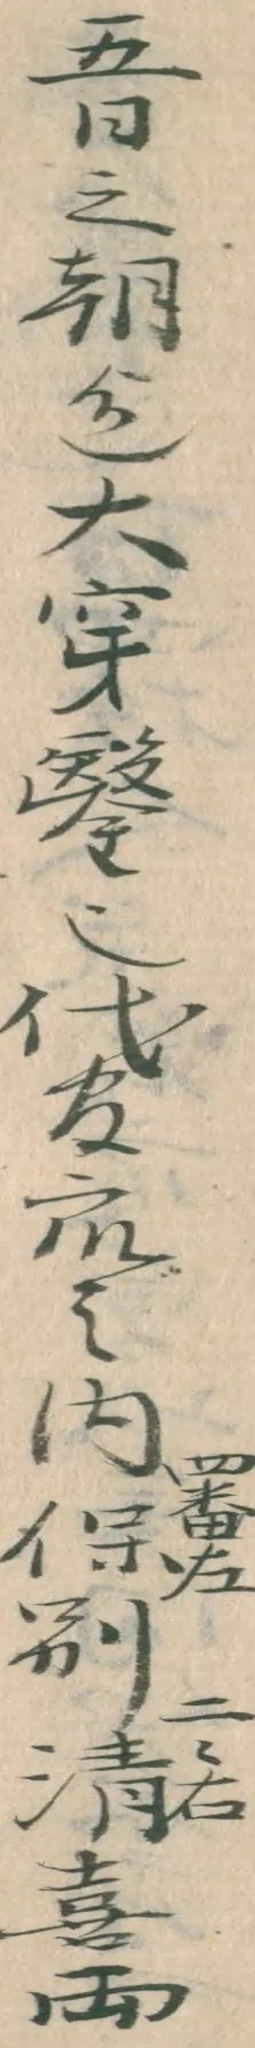五日之朝迄大穿鑿也代官衆之内保別清喜両
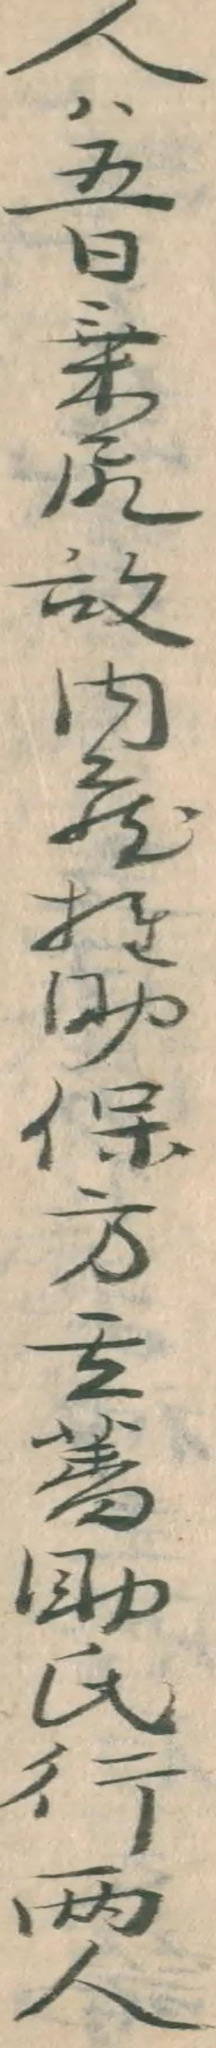人ハ五日乗尻故内蔵権助保方玄蕃助氏行両人
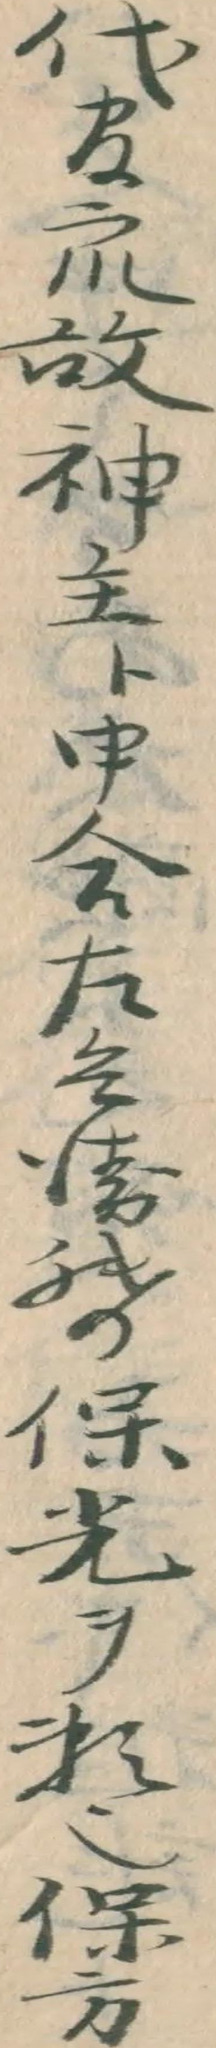代官衆故神主ト申合左兵衛督保光ヲ頼也保方
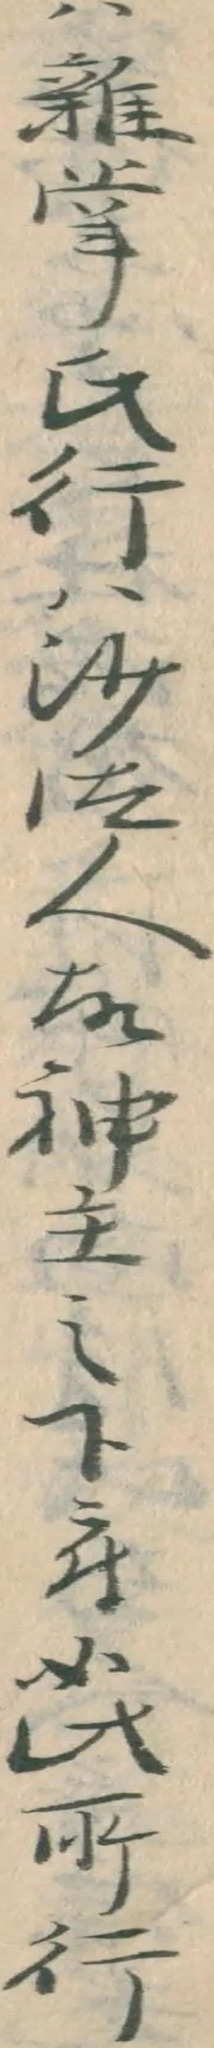ハ雑掌氏行ハ沙汰人故神主之下ニ付如此所行

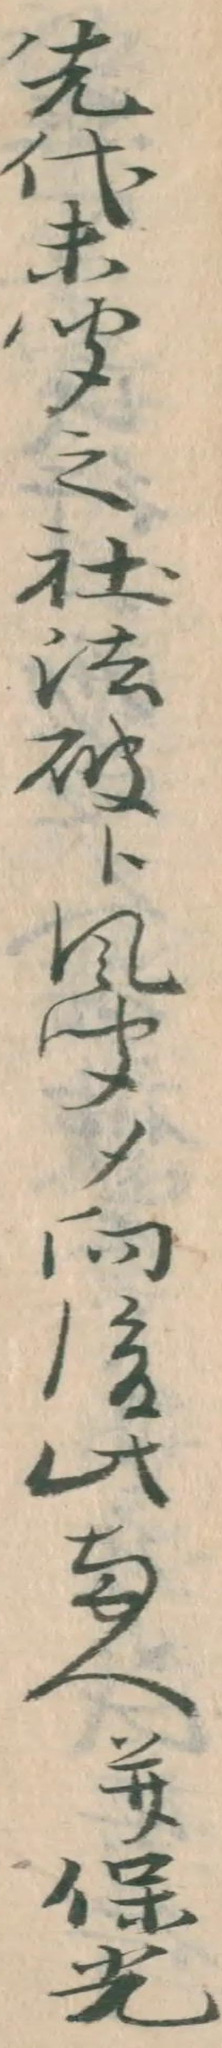先代未聞之社法破ト風聞シテ向後此両人并保光
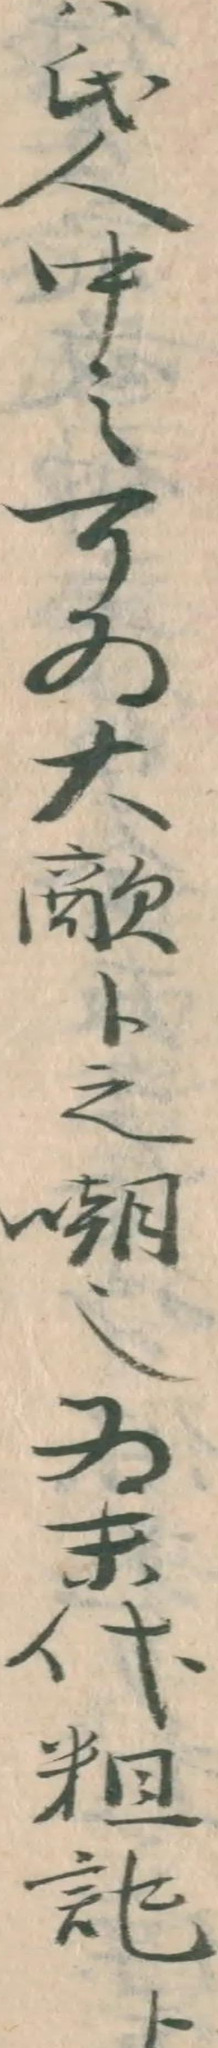ハ氏人中之可為大敵ト之嘲也為末代粗記ト
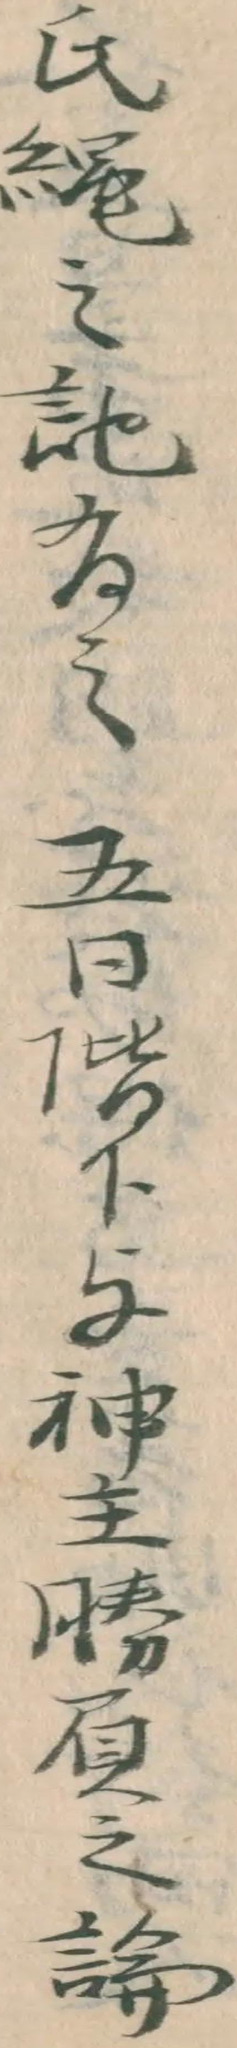氏縄之記有之五日階下与神主勝負之論
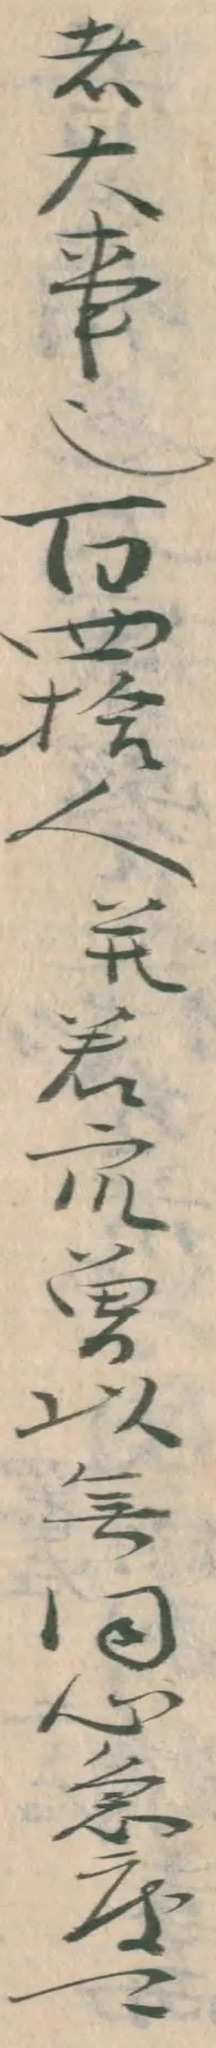者大事也百四拾人并若衆曽以無同心急度可
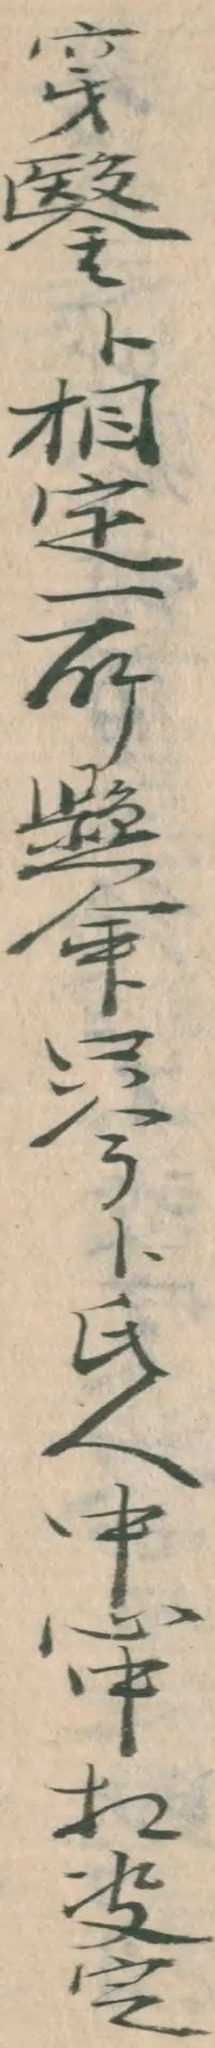穿鑿ト相定一所懸命只今ト氏人中心中相決定
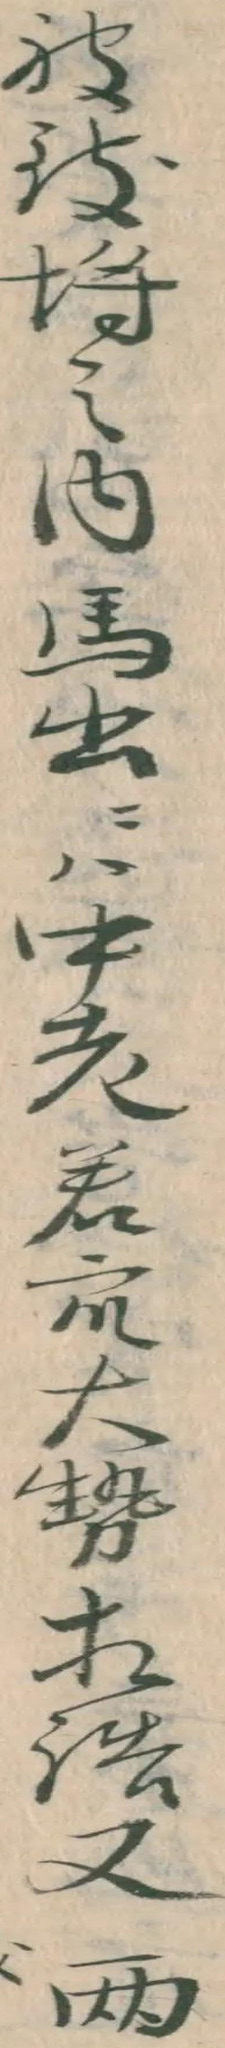被致埒之内馬出ニハ中老若衆大勢相詰又両
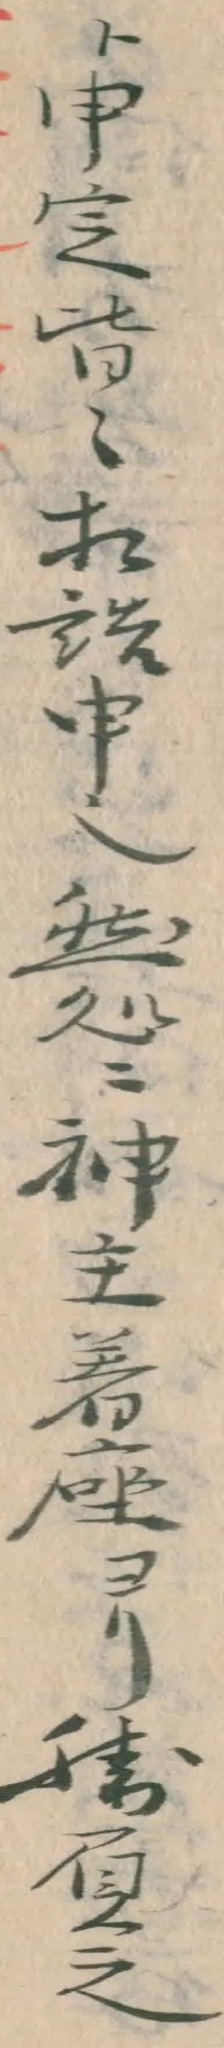ト申定皆々相詰申也然処ニ神主着座ヨリ勝負之
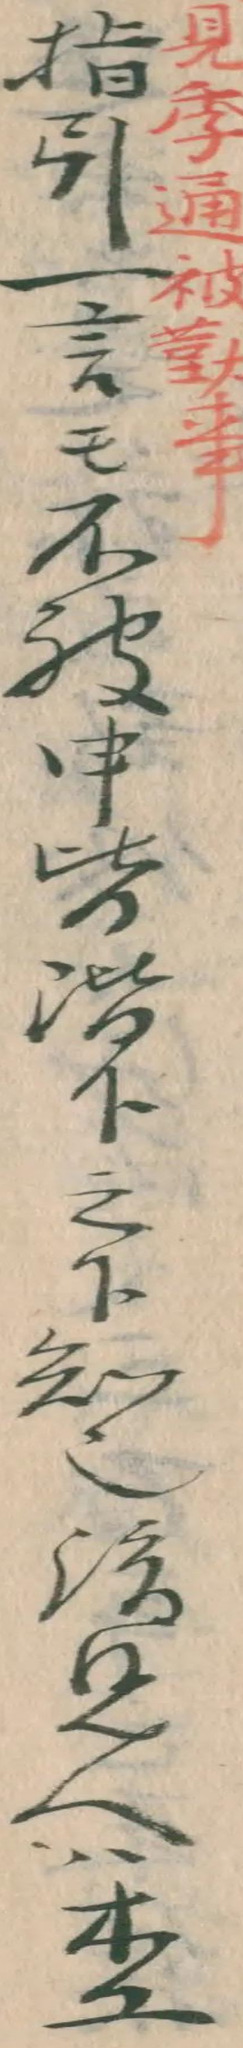指引一言モ不被申皆階下之下知也後見ヘハ木工
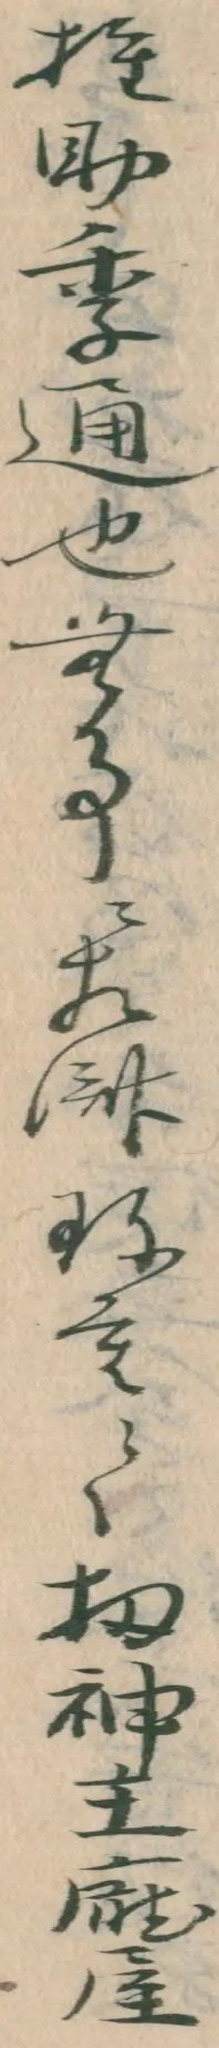権助季通也無事ニ相済珍重云々扨神主庁屋
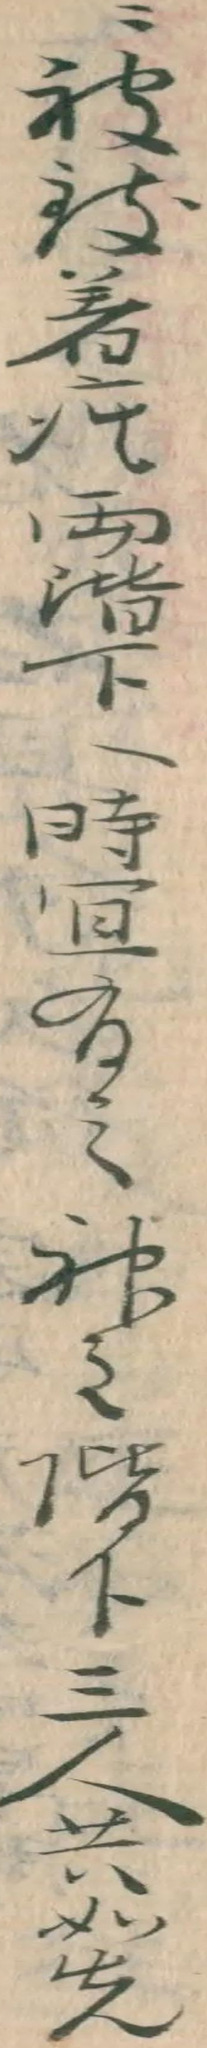ニ被致着座両階下へ時宜有之神主階下三人共如先
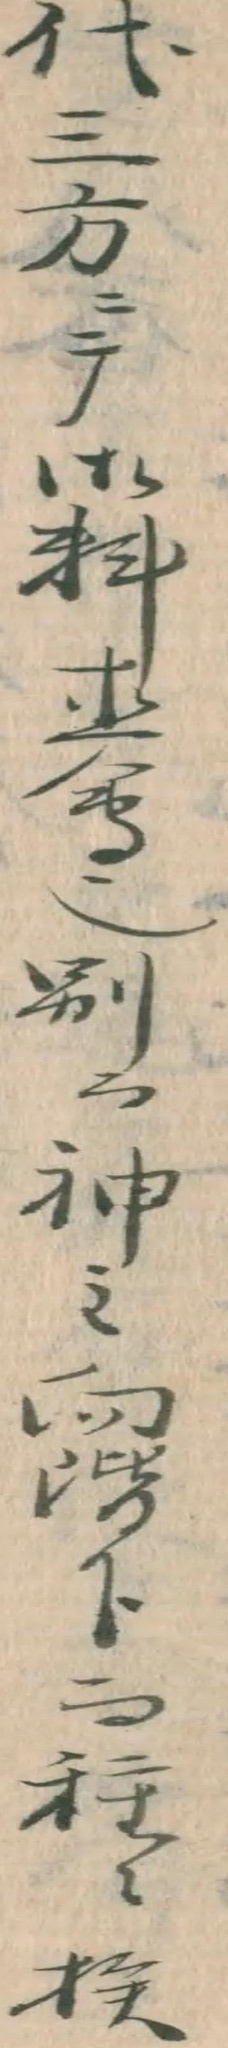代三方ニテ御料直会也別而神主向階下而種々挨
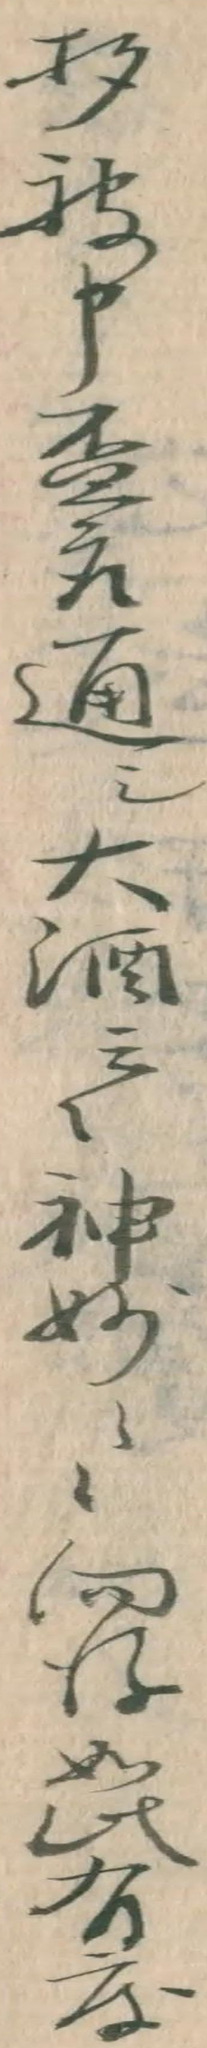拶被申盃取通シ大酒云々神妙々々向後如此有度
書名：賀茂社記録. 第10冊
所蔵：国立国会図書館 National Diet Library, JAPAN
